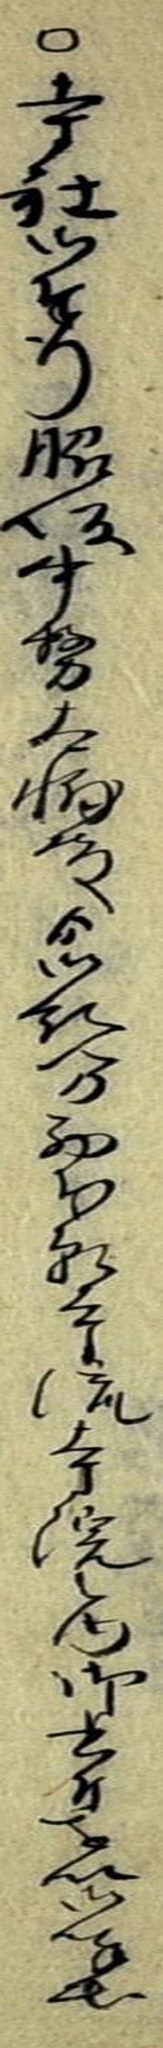○寺社御奉行脇坂中務太輔殿ゟ御領分西本願寺流寺院之内御書付を以御呼出
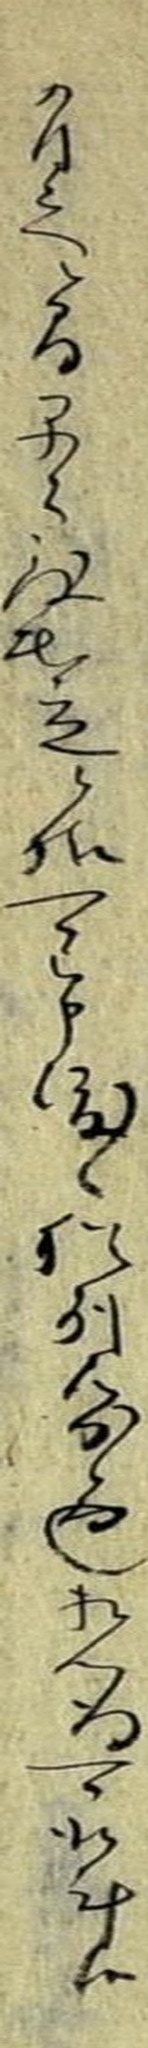有之候間早々致出立候様可被申渡候猶別紙之通相心得可取斗候
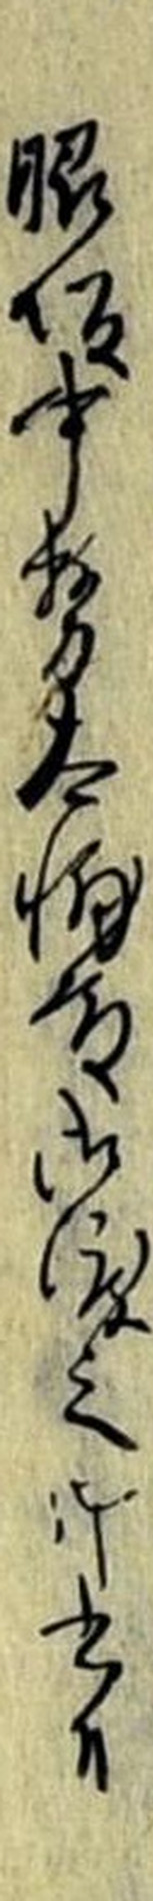脇坂中務太輔殿御渡之御書付
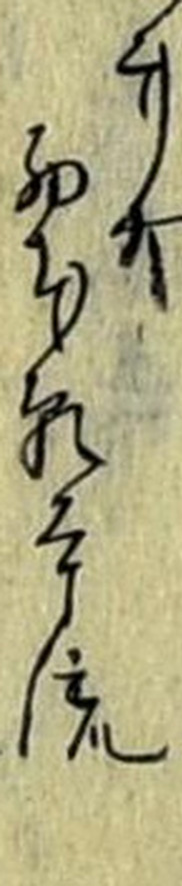西本願寺流
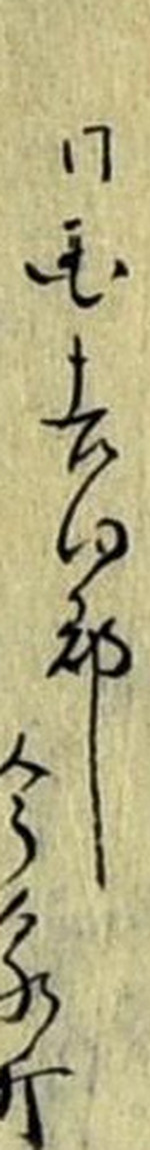同国吉田郡今泉村
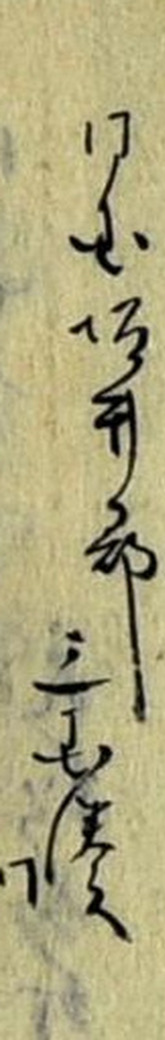同国坂井郡三国湊
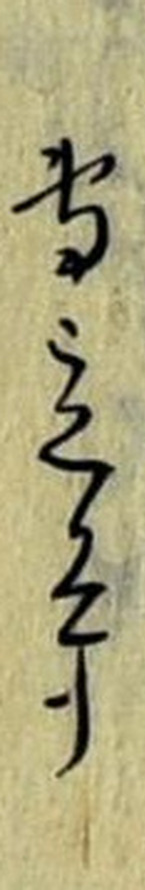専立寺

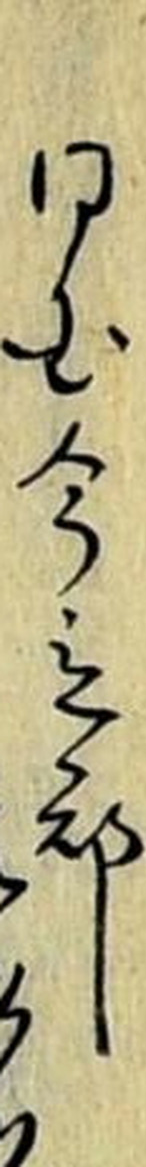同国今立郡
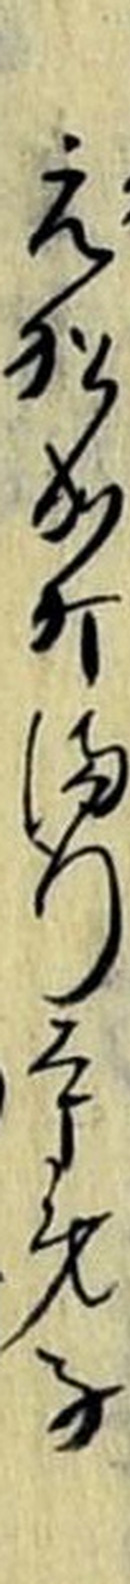元松成村満行寺弟子
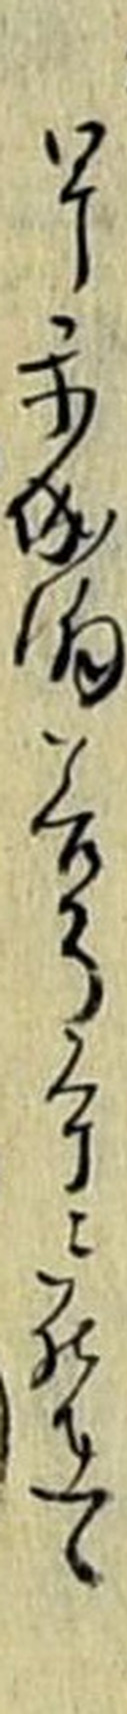甲楽城浦善了寺に罷在候
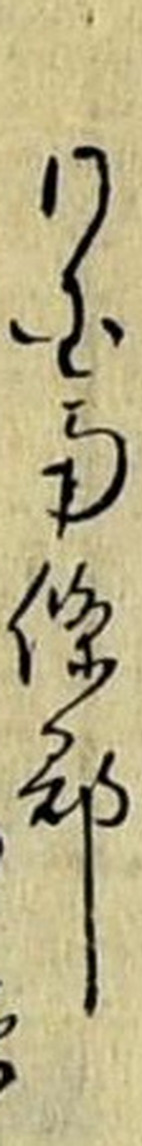同国南條郡
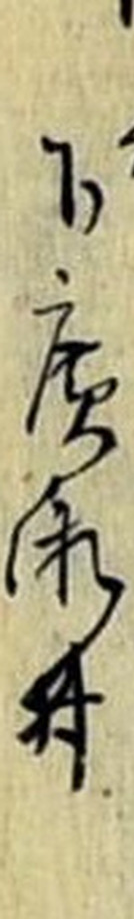下広瀬村
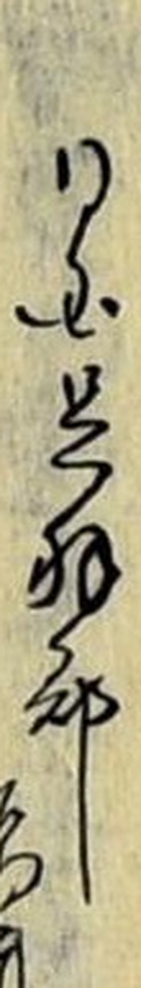同国足羽郡
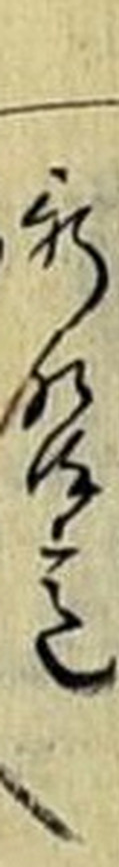五左衛門
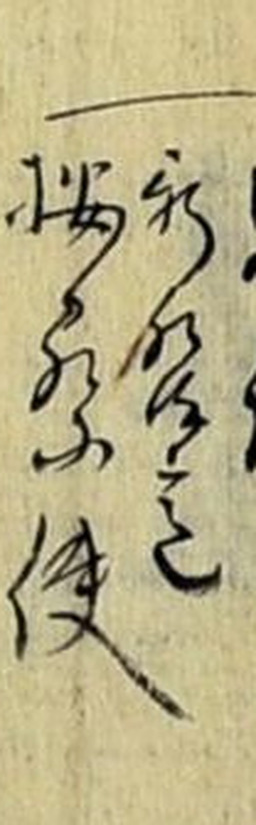按察使
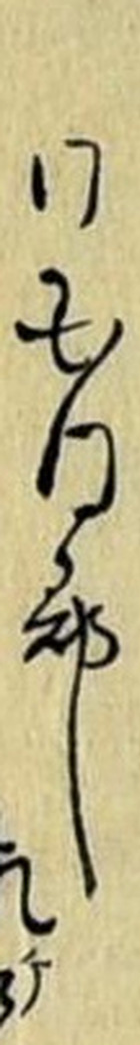同国同郡
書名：命令之部 四
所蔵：福井県文書館 Fukui Prefectural Archives
